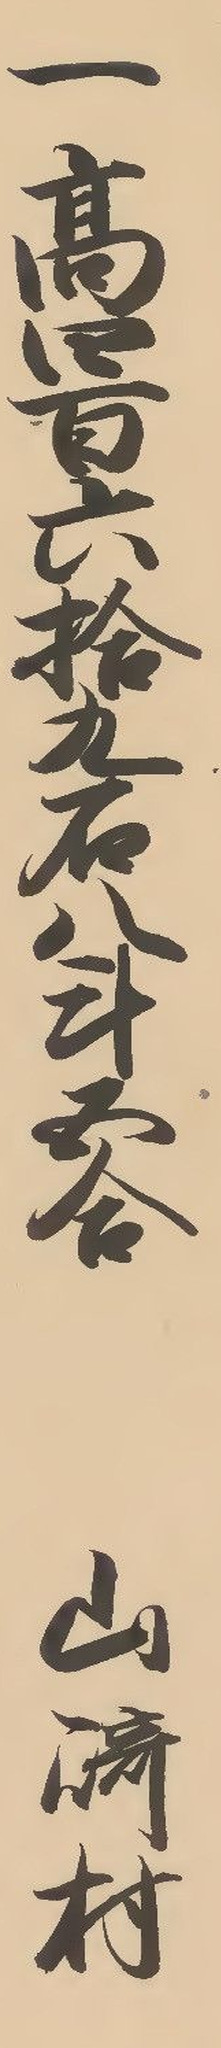一高四百六拾九石八斗五合山崎村
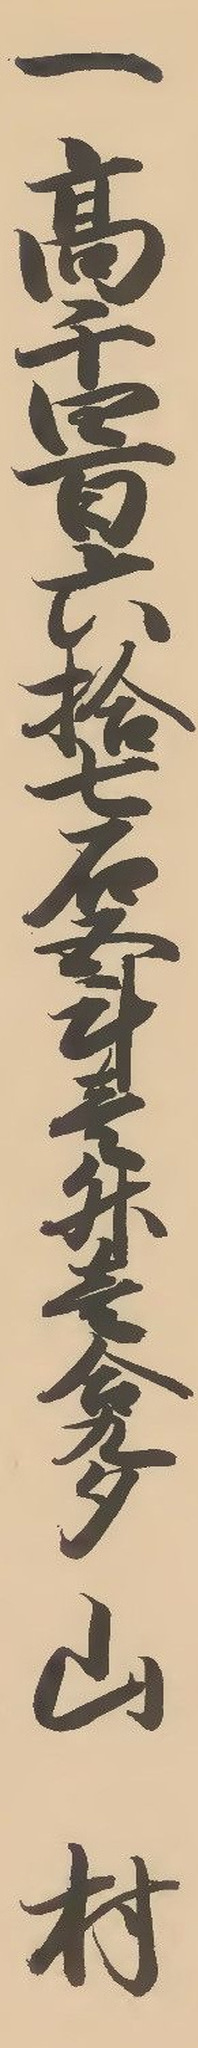一高千四百六拾七石五斗壱升壱合九勺山村
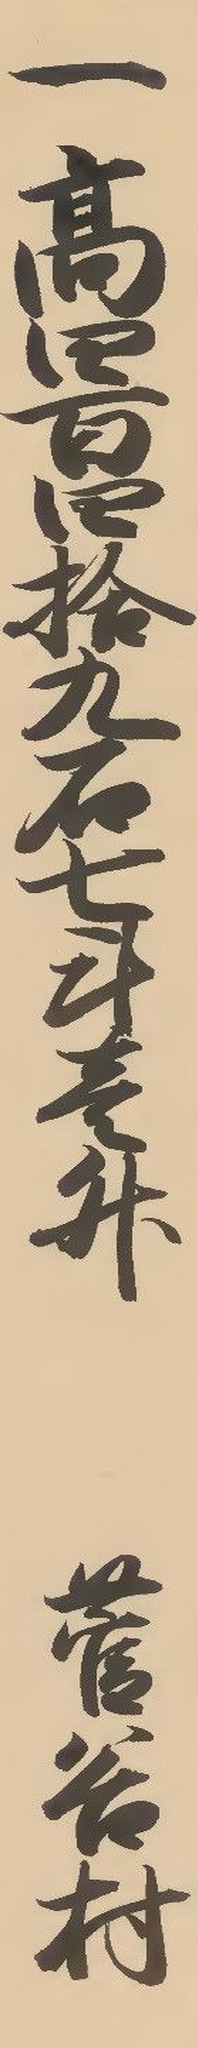一高四百四拾九石七斗壱升菅谷村
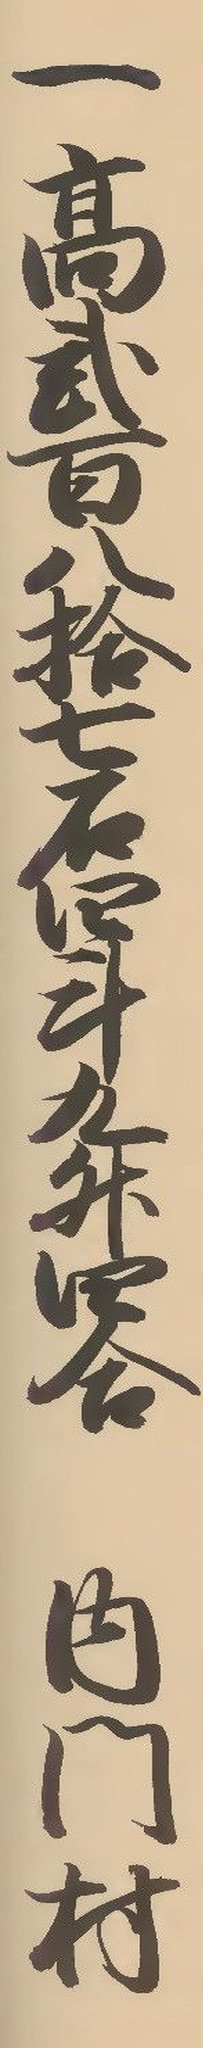一高弐百八拾七石四斗九升四合内門村
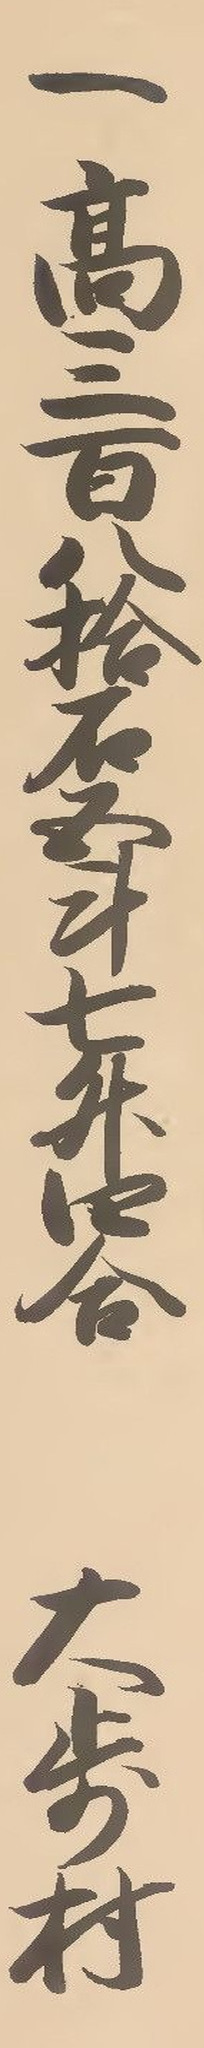一高三百八拾石五斗七升四合大歩村
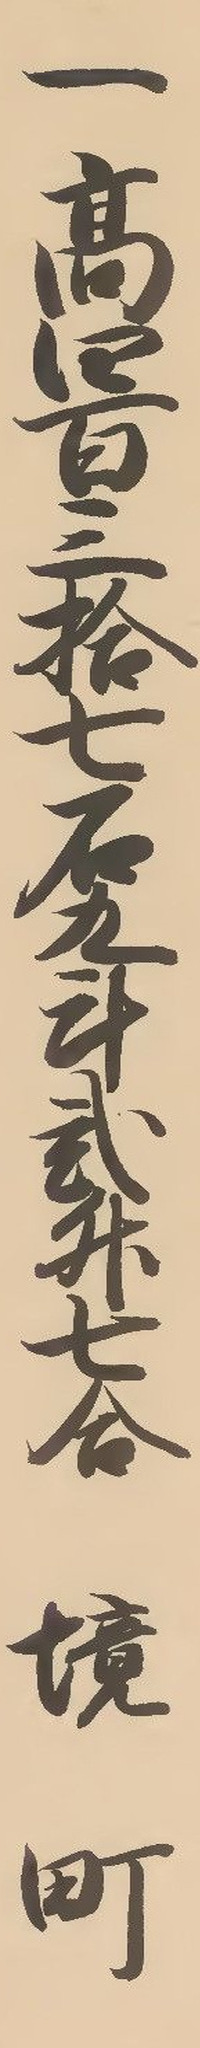一高四百三拾七石九斗弐升七合境町
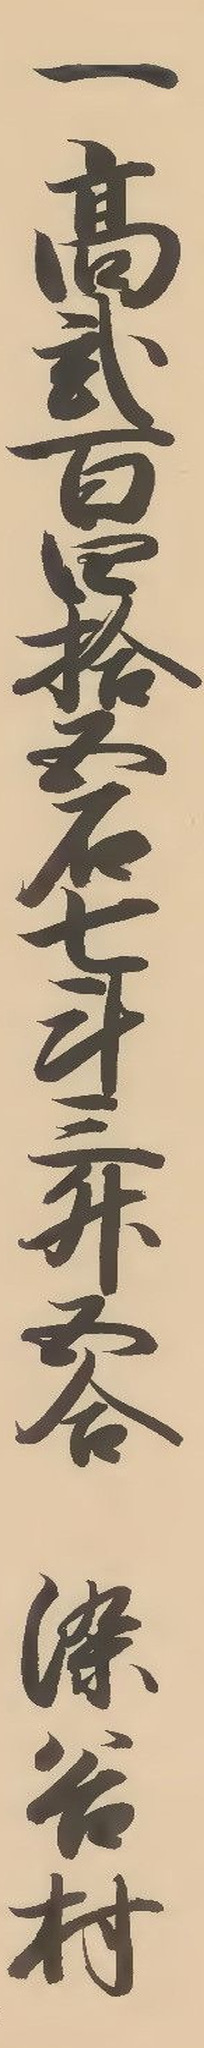一高弐百四拾五石七斗三升五合染谷村
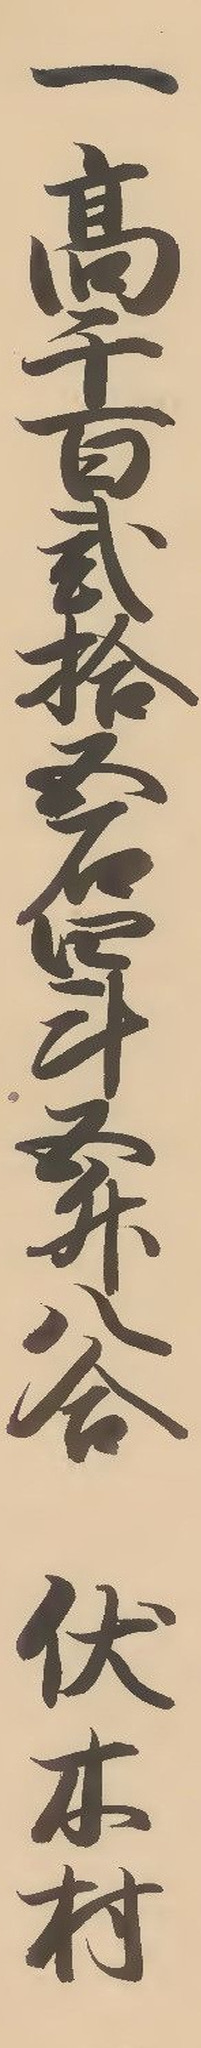一高千百弐拾五石四斗五升八合伏木村

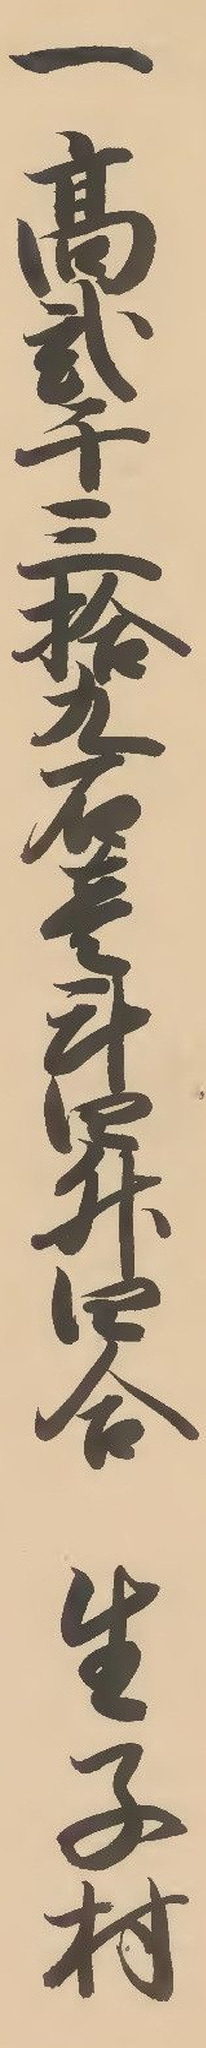一高弐千三拾九石壱斗四升四合生子村
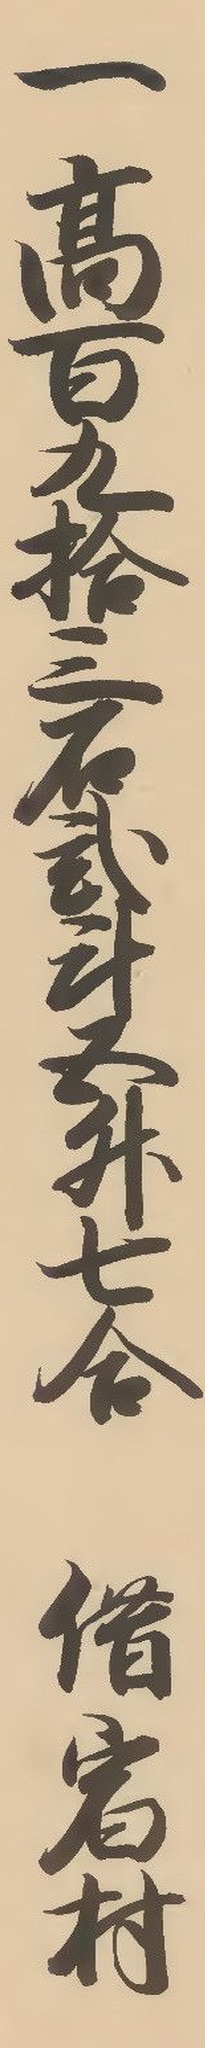一高百九拾三石弐斗五升七合借宿村
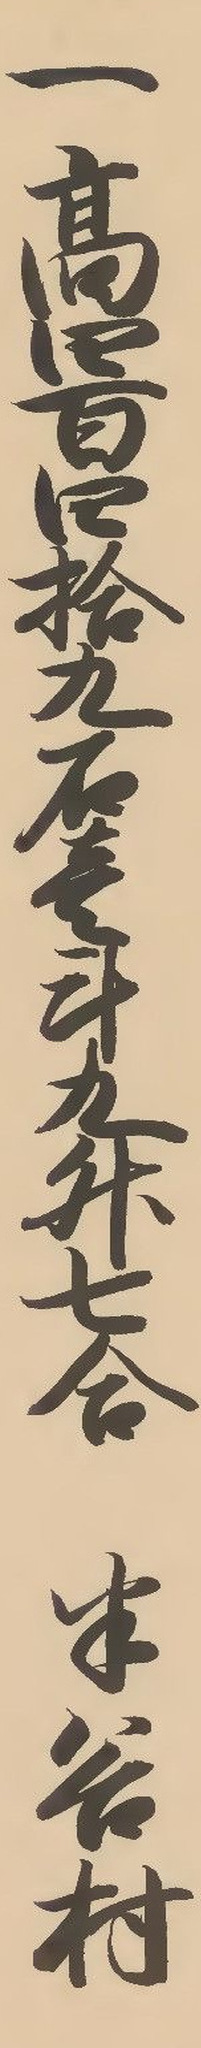一高四百四拾九石壱斗九升七合半谷村
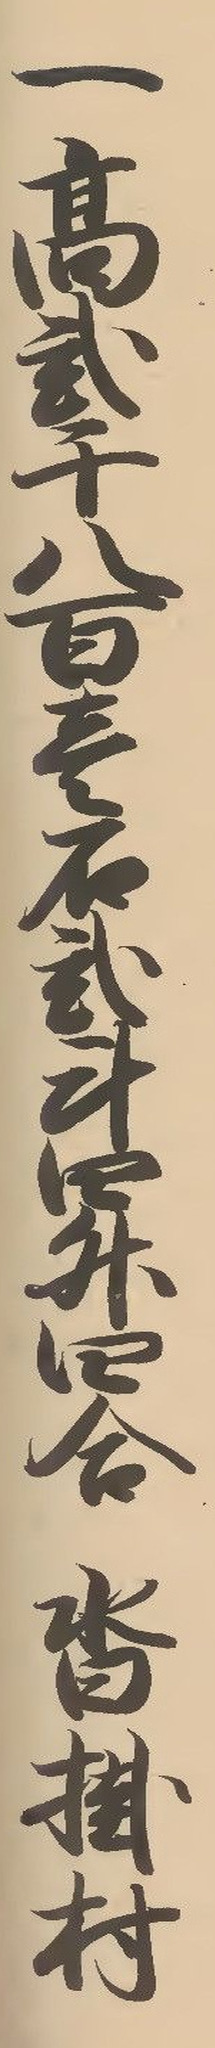一高弐千八百壱石弐斗四升四合沓掛村
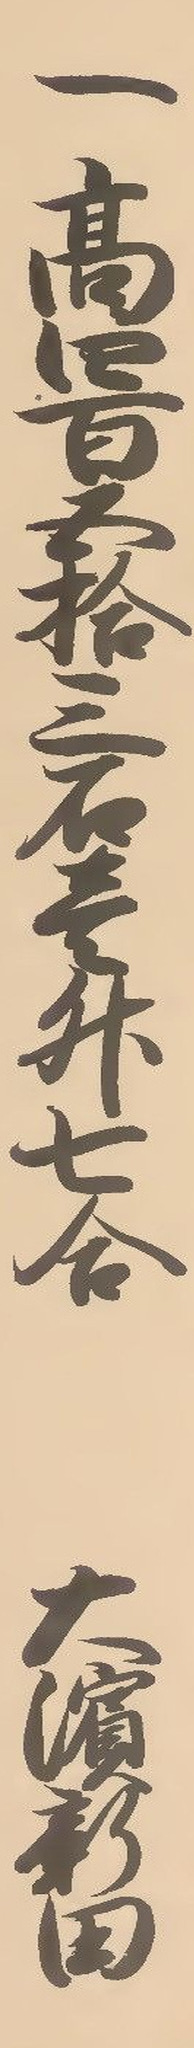一高四百五拾三石壱升七合大浜新田
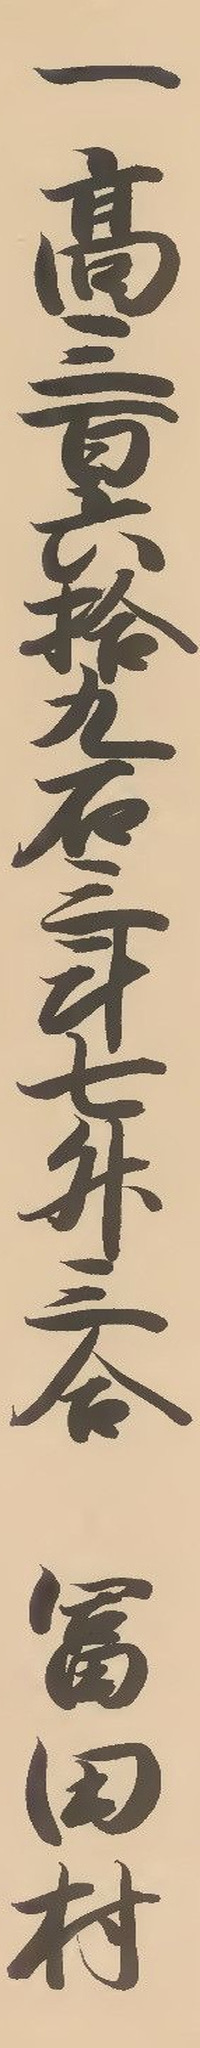一高三百六拾九石三斗七升三合富田村
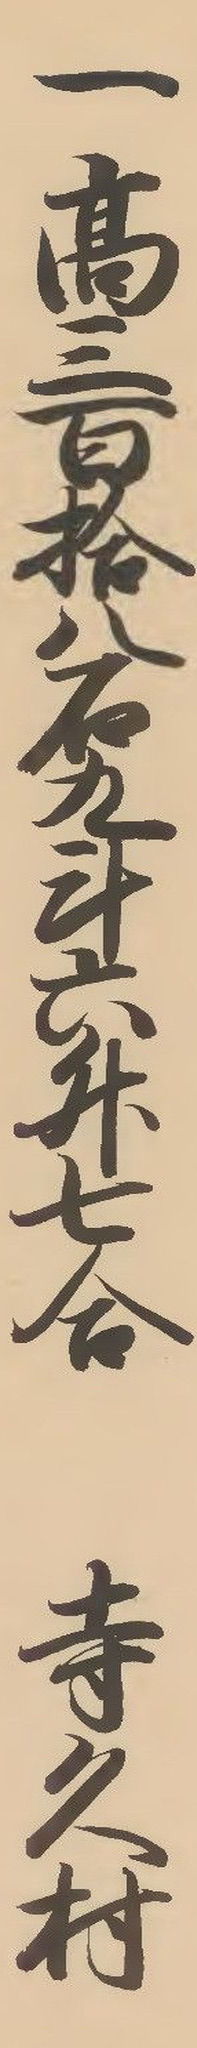一高三百拾八石九斗六升七合寺久村
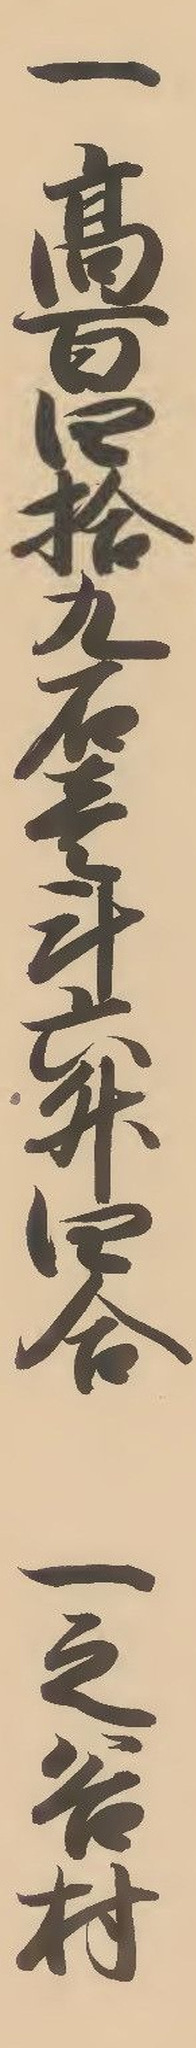一高百四拾九石壱斗六升四合一之谷村
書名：下総国郷帳
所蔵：国立公文書館 National Archives of Japan
